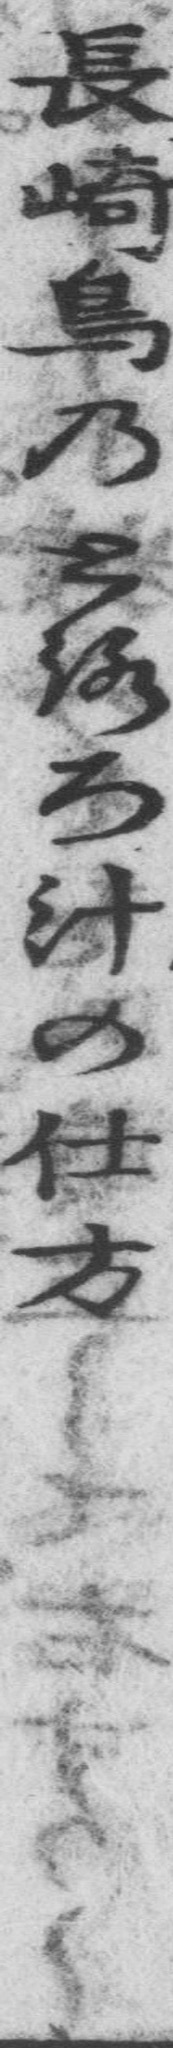長崎鳥のとろろ汁の仕方
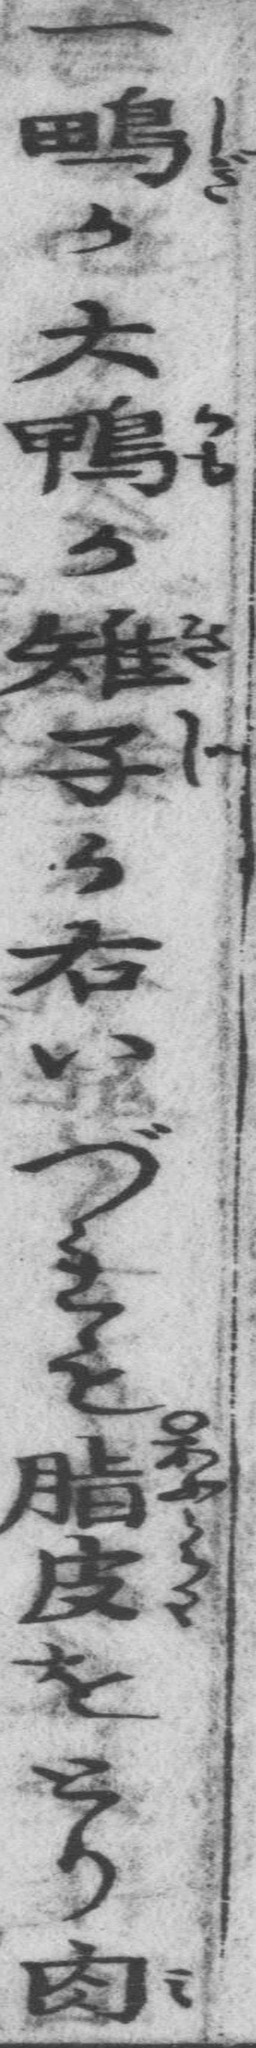一鴫か大鴨か雉子か右いづれも。脂皮をとり肉
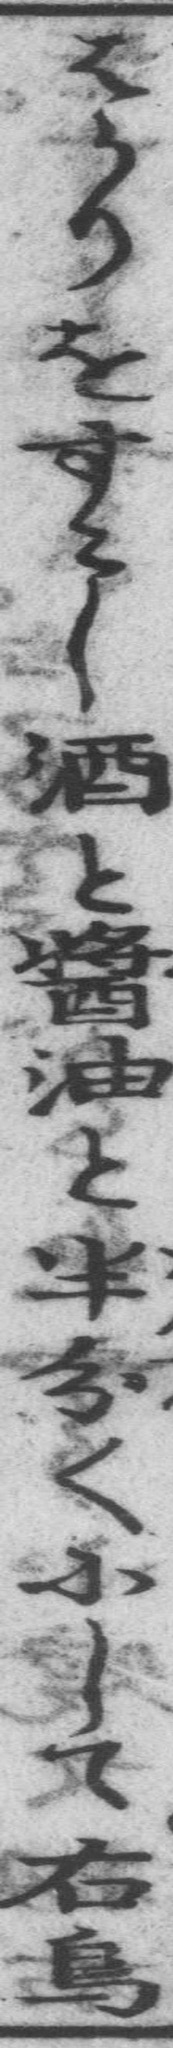はかりをすこし酒と。醤油と半分〳〵にして。右鳥

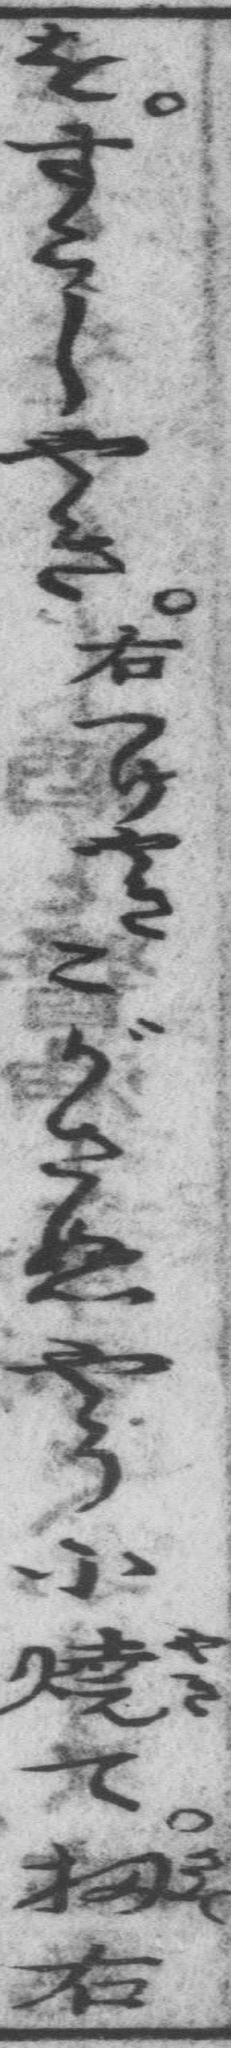を。すこしやき。右つけやきこがさぬやうに焼て。扨右
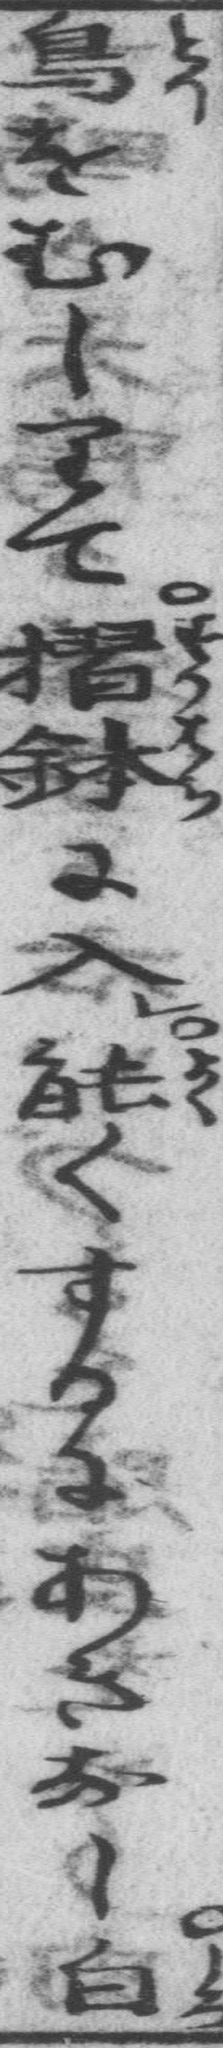鳥をむしりて。摺鉢に入れ。能〳〵するにあきなし。白
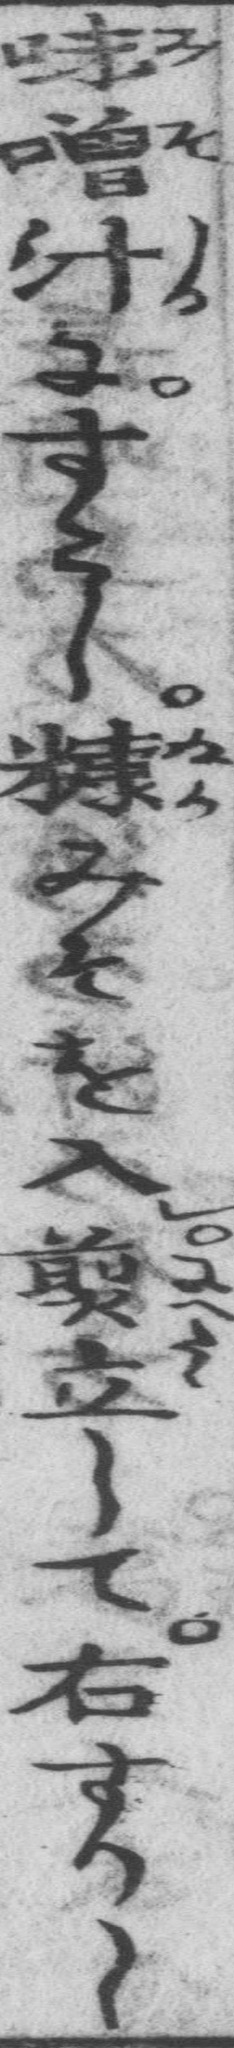味噌汁に。すこし。糠みそを入れ。煎立して。右すりし
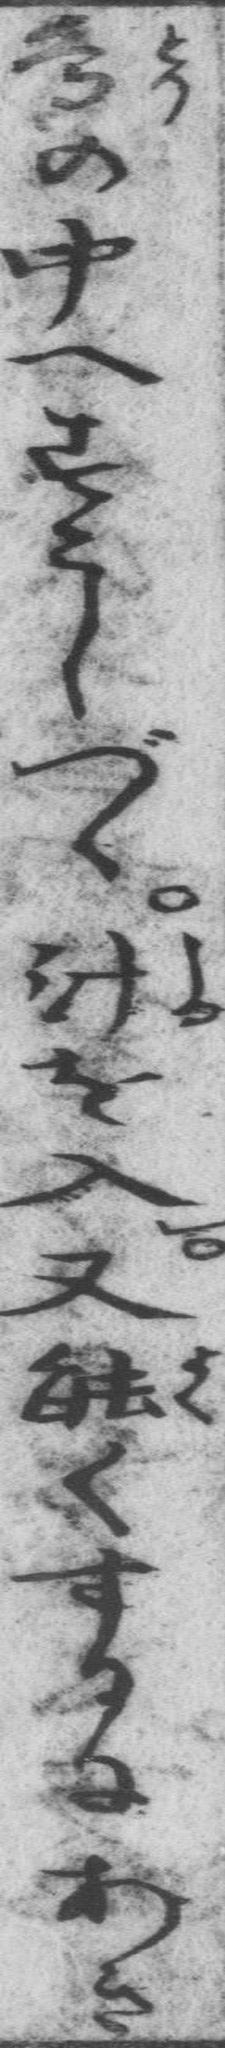鳥の中へすこしづゝ。汁を入れ。又能するにあき
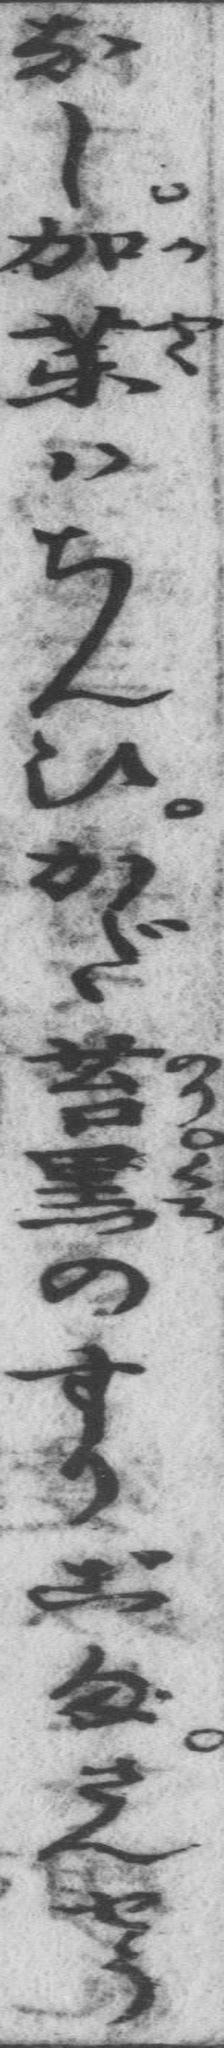なし。加薬はちんひ。かゞ苔。黒のすりごま。さんせう
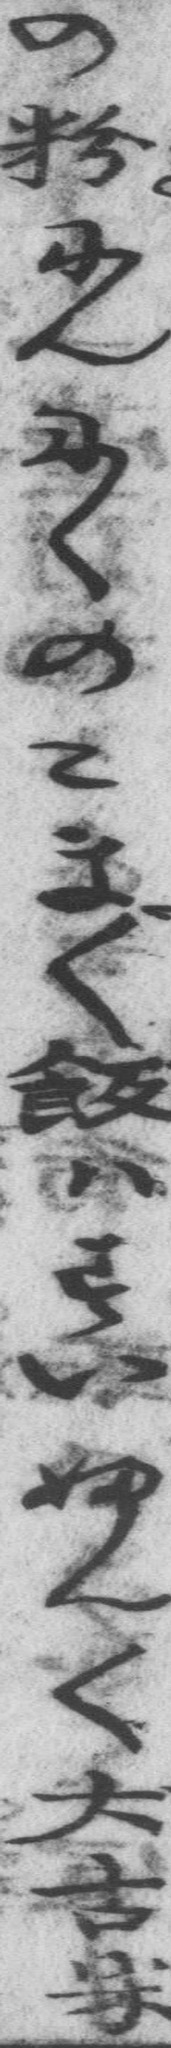の粉。にんにくのこま〴〵。飯はすいふん〳〵大古米
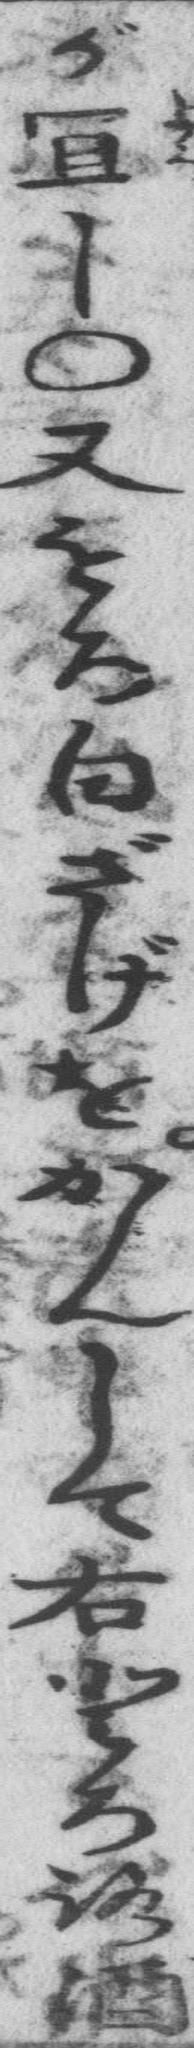が宜し○又もろ白ざげを。かんして右とろろ酒
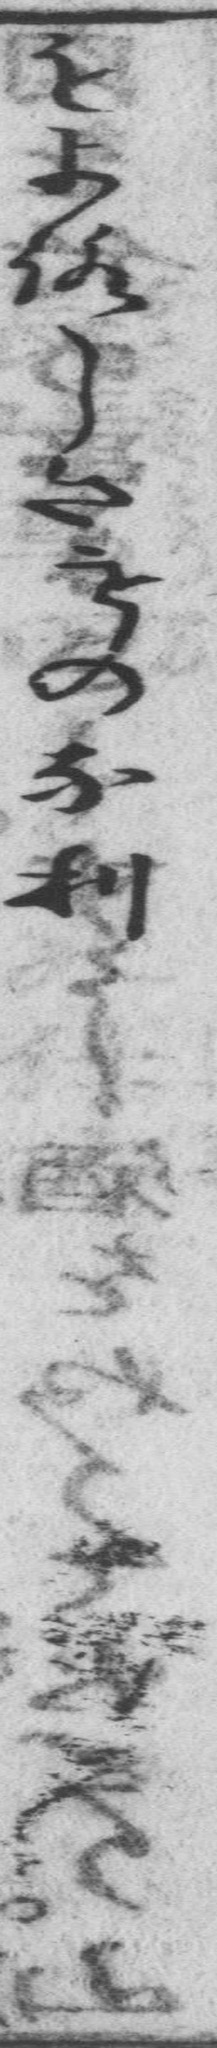もよろしきものなり
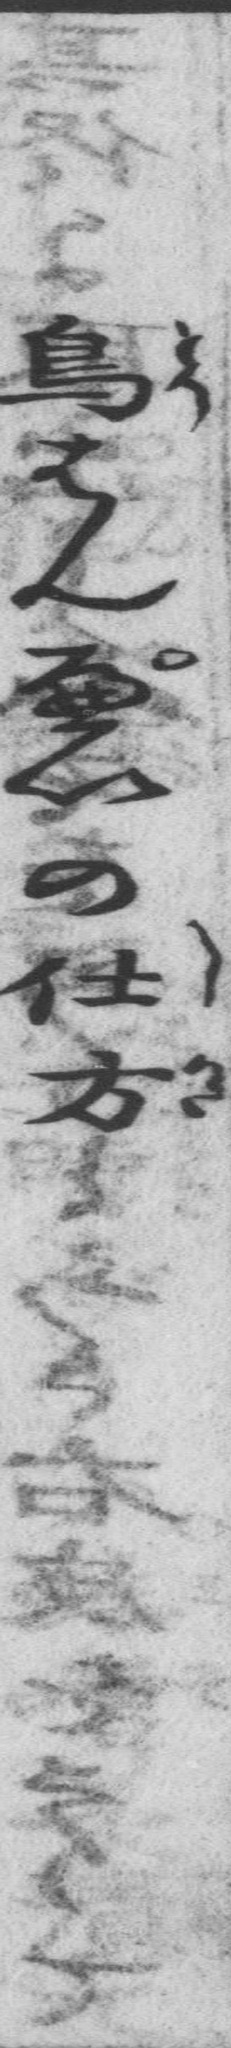鳥はんぺいの仕方
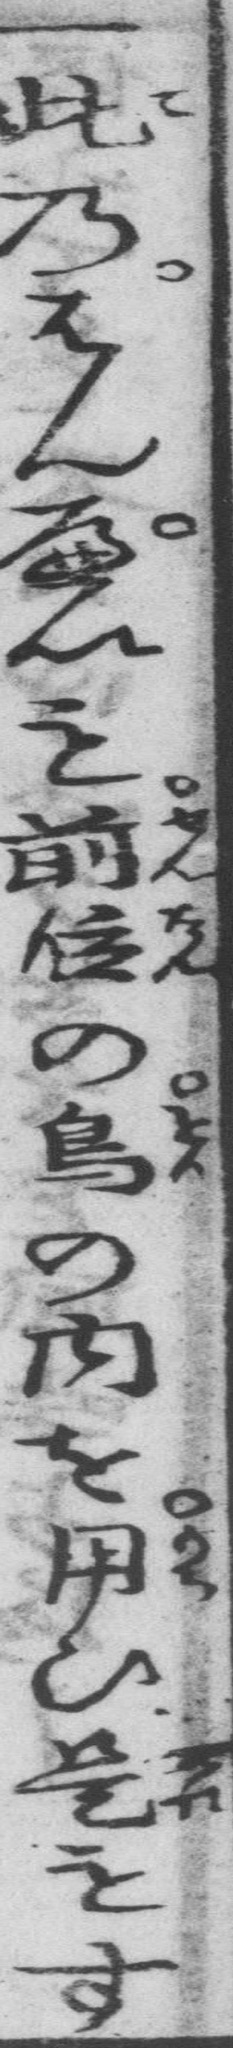一此の。はんぺいも。前段の。鳥の内を。用ひ是もす
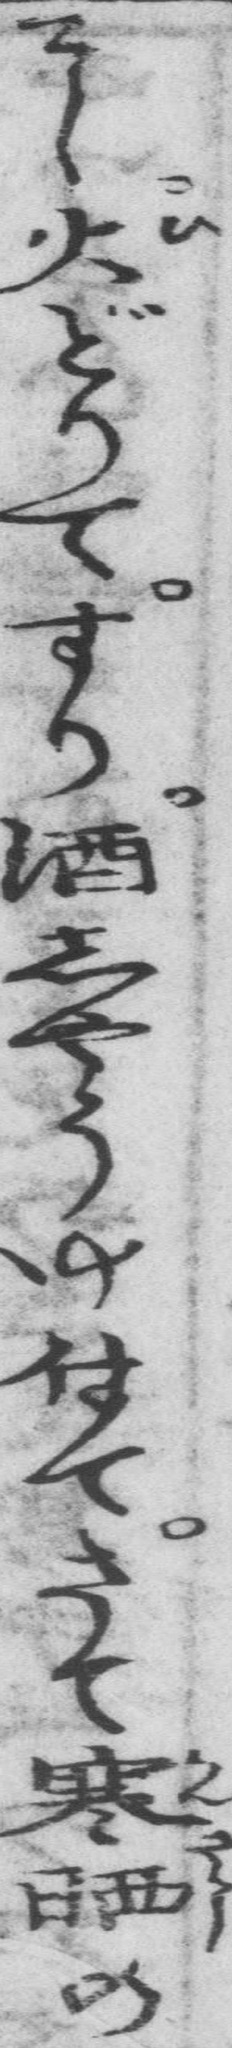こし。火どりて。すり。酒しやうゆ付て。さて寒晒の
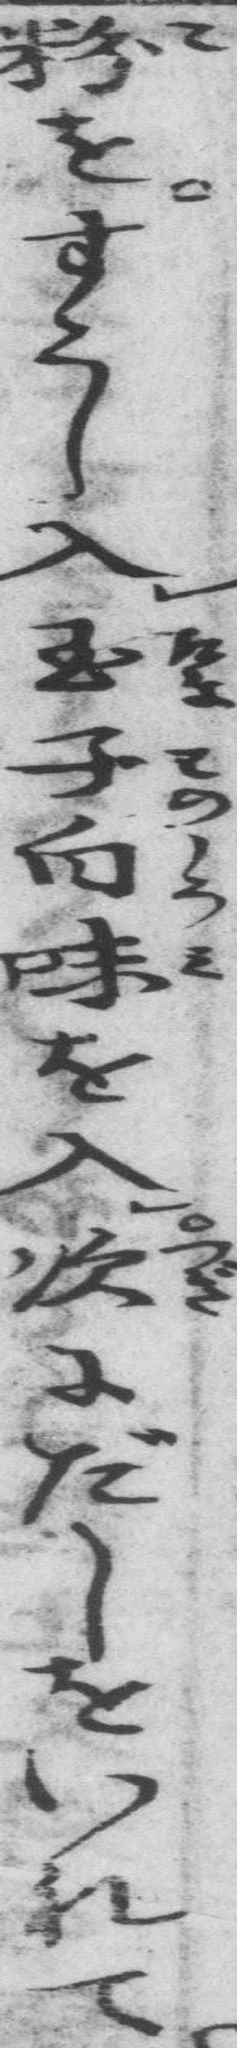粉を。すこし入れ玉子白味を入れ。次にだしをいれて。
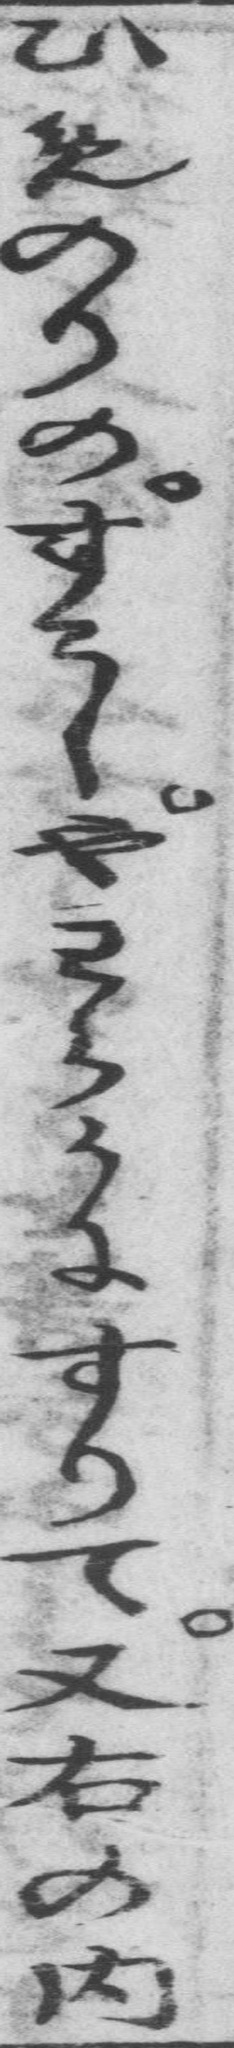ひめのりの。すこし。やわらかにすりて。又右の内
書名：萬寳料理秘密箱
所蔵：大阪府立大学学術情報センター 国文学研究資料館
